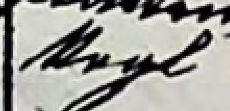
kog
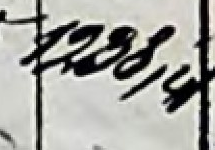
1238/4
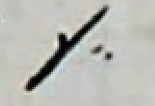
./.
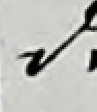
Do
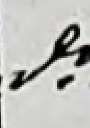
Do
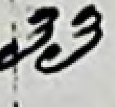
33
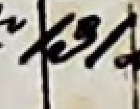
131
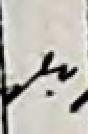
Do
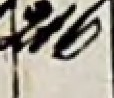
216
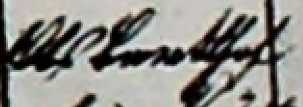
Als B???hof
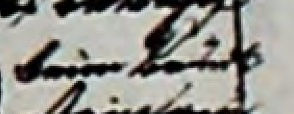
beim ???
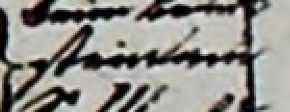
Steind??
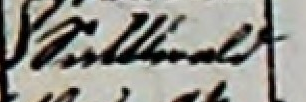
Sattlwald
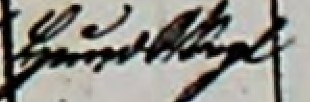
Hundskogl
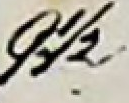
9 1/2
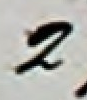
2
